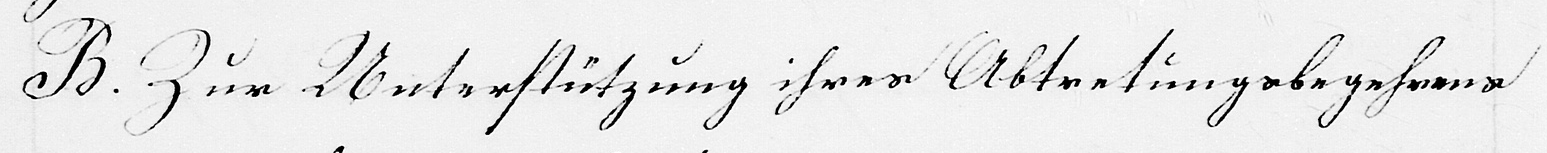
B. Zur Unterstützung ihres Abtretungsbegehrens
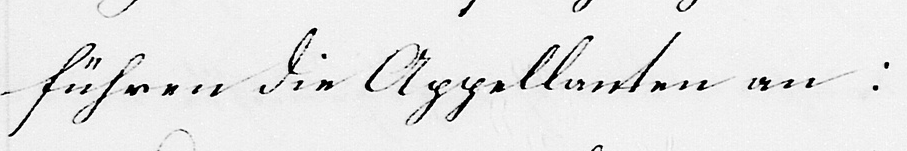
führen die Appellanten an:
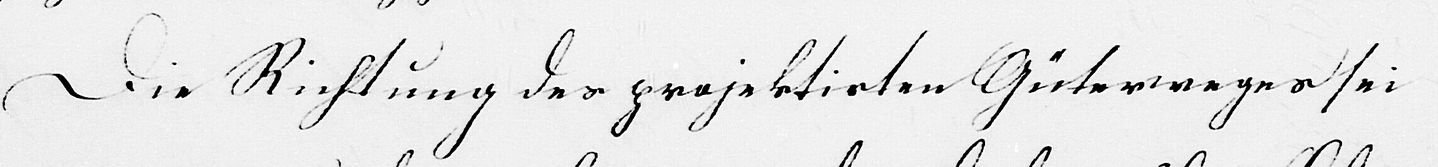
Die Richtung des projektirten Güterweges sei
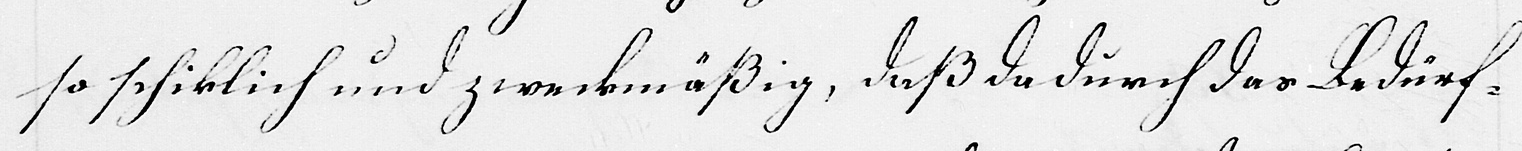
so schiklich und zweckmäßig, daß dadurch das Bedürf¬
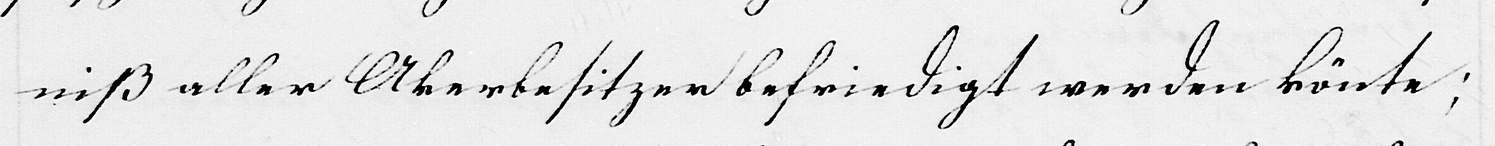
niß aller Akerbesitzer befriedigt werden könnte;
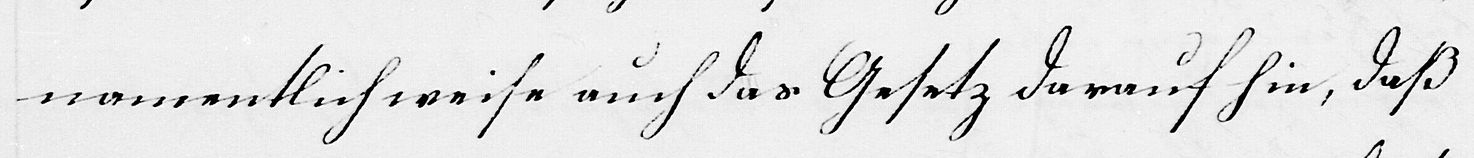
namentlich weise auch das Gesetz darauf hin, daß
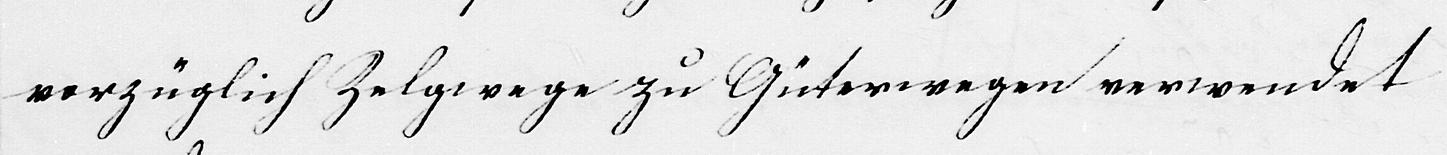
vorzüglich Zelgwege zu Güterwegen verwendet
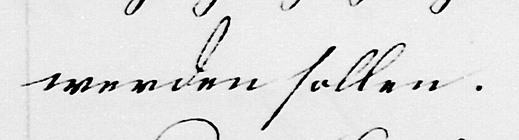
werden sollen.
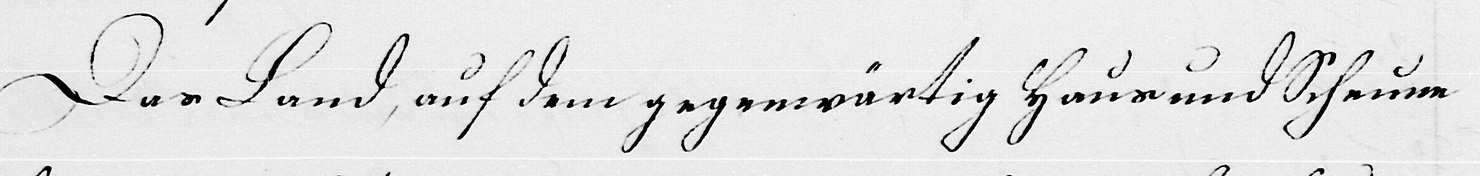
Das Land, auf dem gegenwärtig Haus und Scheune
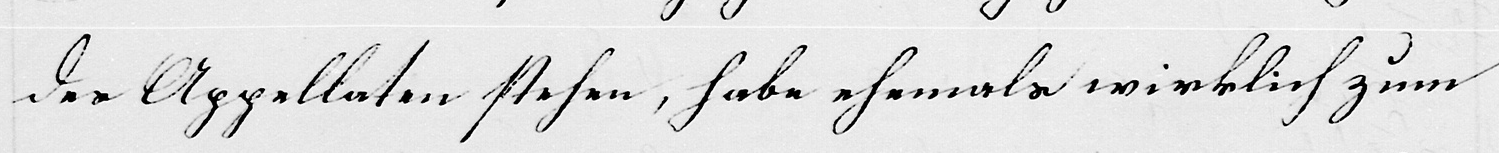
des Appellaten stehen, habe ehemals wirklich zum
